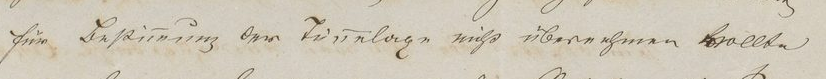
für Bestimmung der Tunnelage nicht übernehmen kwollte
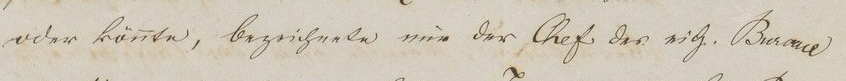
oder könnte, bezeichnete mir der Chef des eidg. Bureau
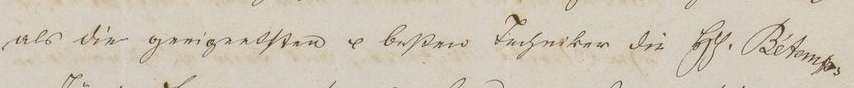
als die geeignetsten & besten Techniker die Hh. Bétemps
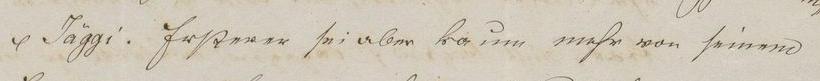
& Jäggi. Ersterer sei aber kaum mehr von seinem
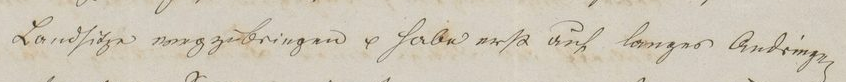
Landsitze wegzubringen & habe erst auf langes Andringen
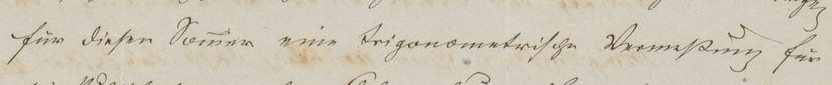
für diesen Sommer eine trigonometrische Vermeßung für
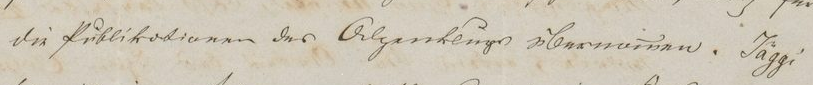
die Publikationen des Alpenklups übernommen. Jäggi
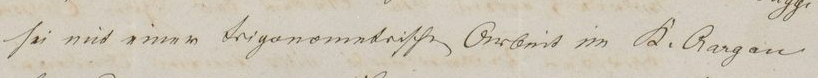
sei mit einer trigonometrischen Arbeit im K. Aargau
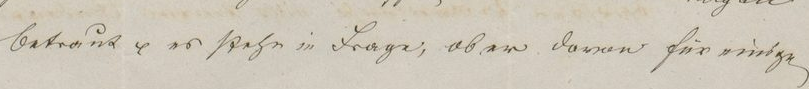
betraut & es stehe in Frage, ob er davon für einige
